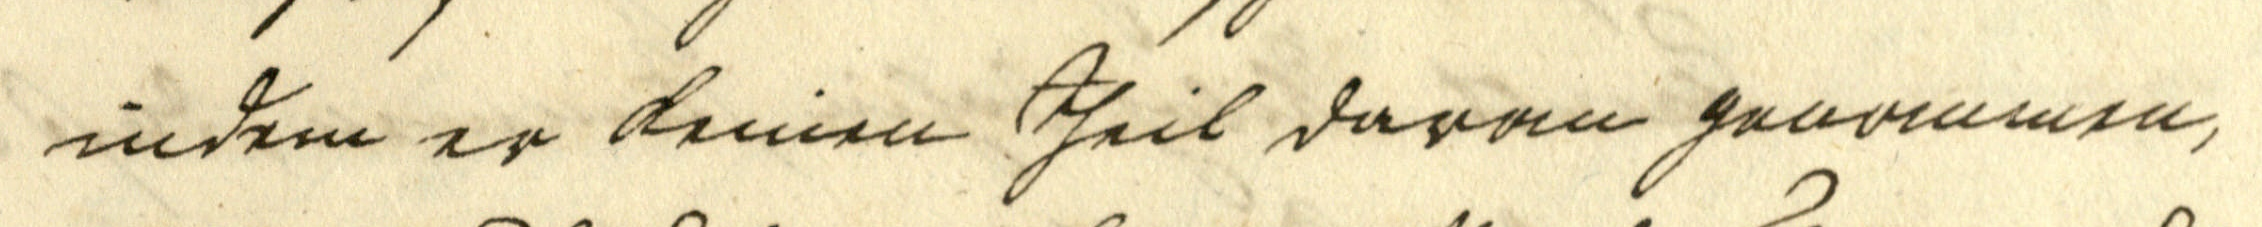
indem er keinen Theil daran genommen,
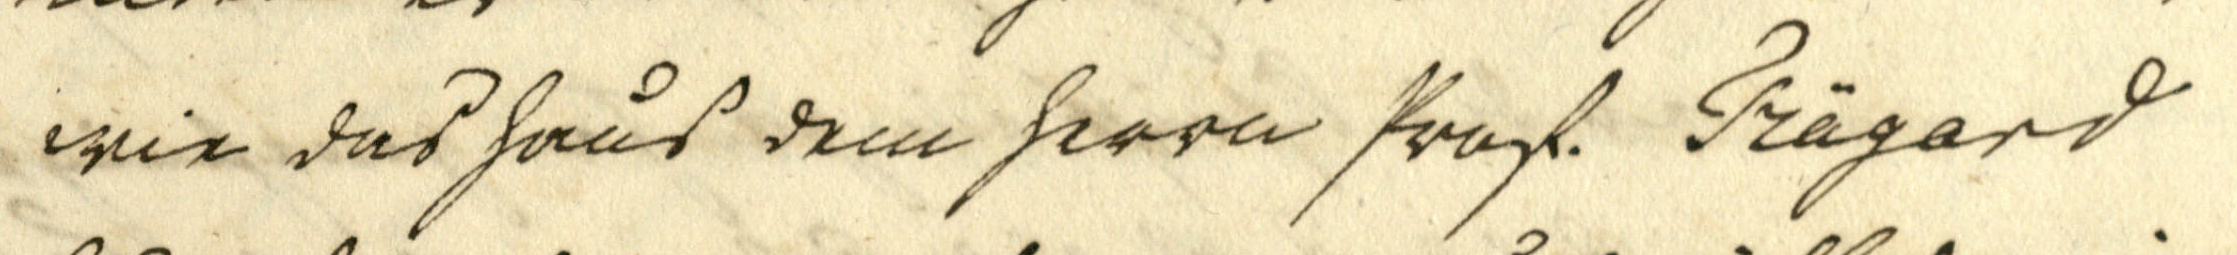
wie das Haus dem Herrn Prof. Trägård
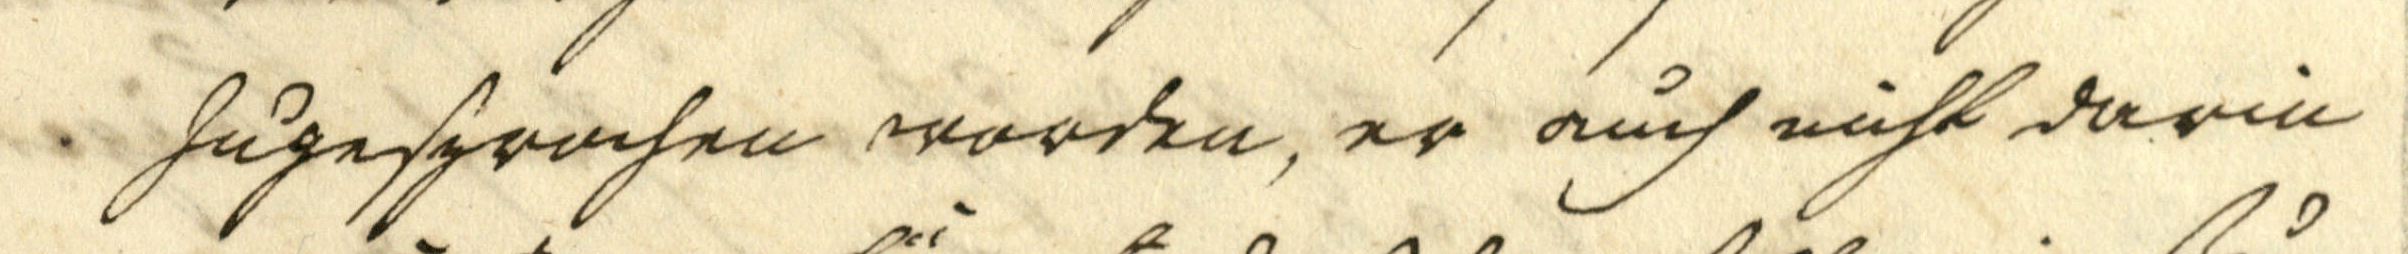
zugesprochen worden, er auch nicht darin
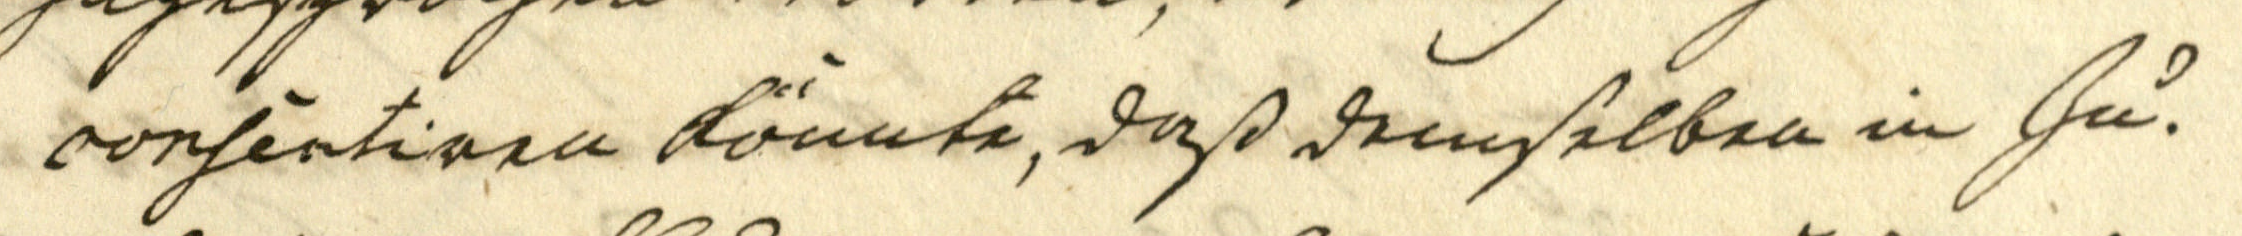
consentiren könnte, daß demselben in Zu¬
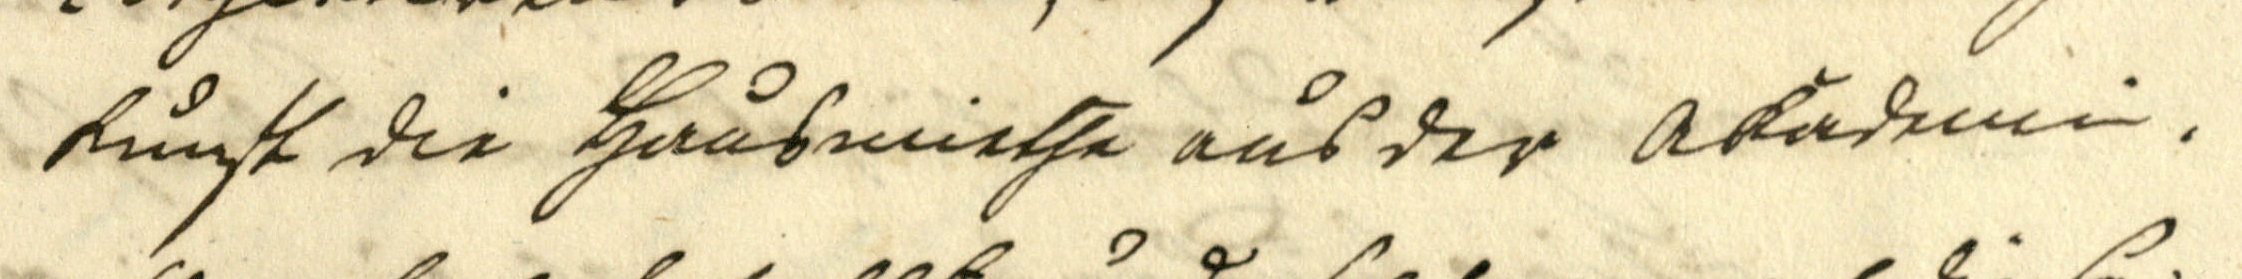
kunft die Hausmiethe aus der akademi¬
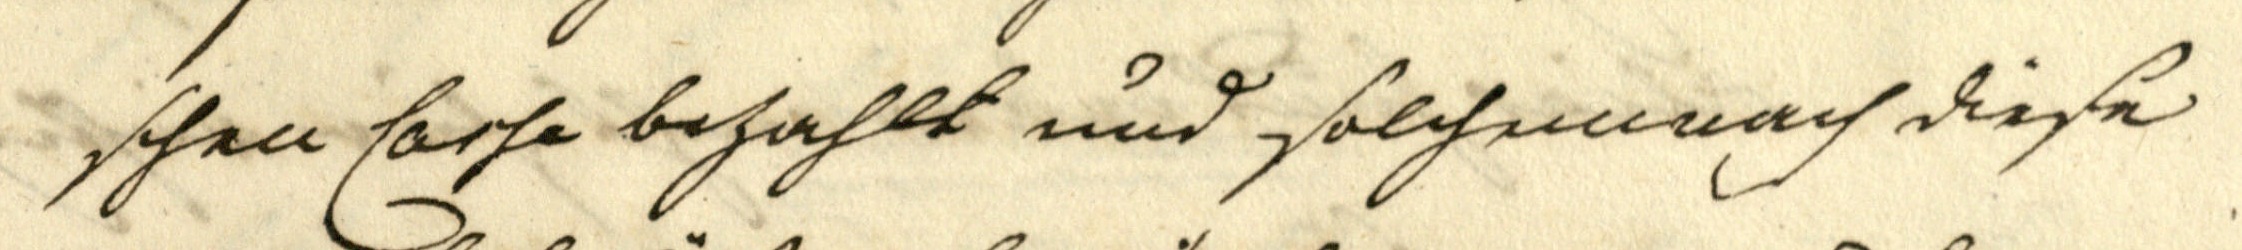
schen Casse bezahlt und solchemnach diese
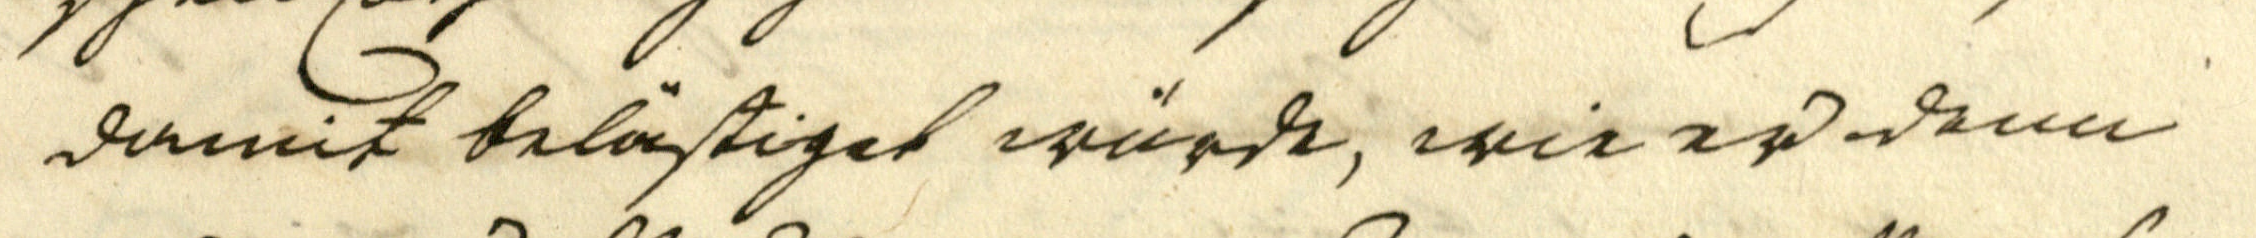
damit belästiget würde, wie er denn
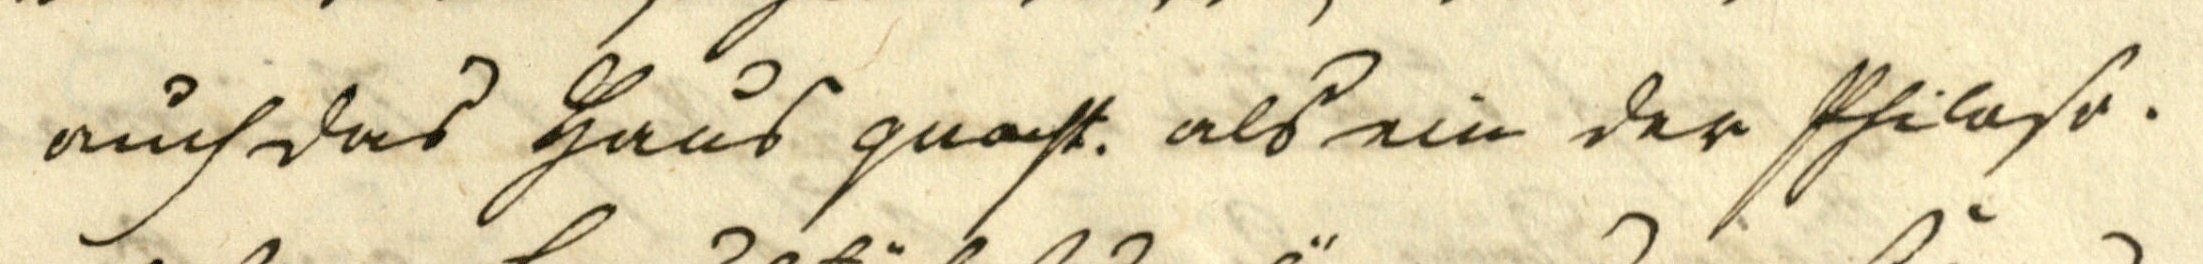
auch das Haus quast. als ein der Philoso¬
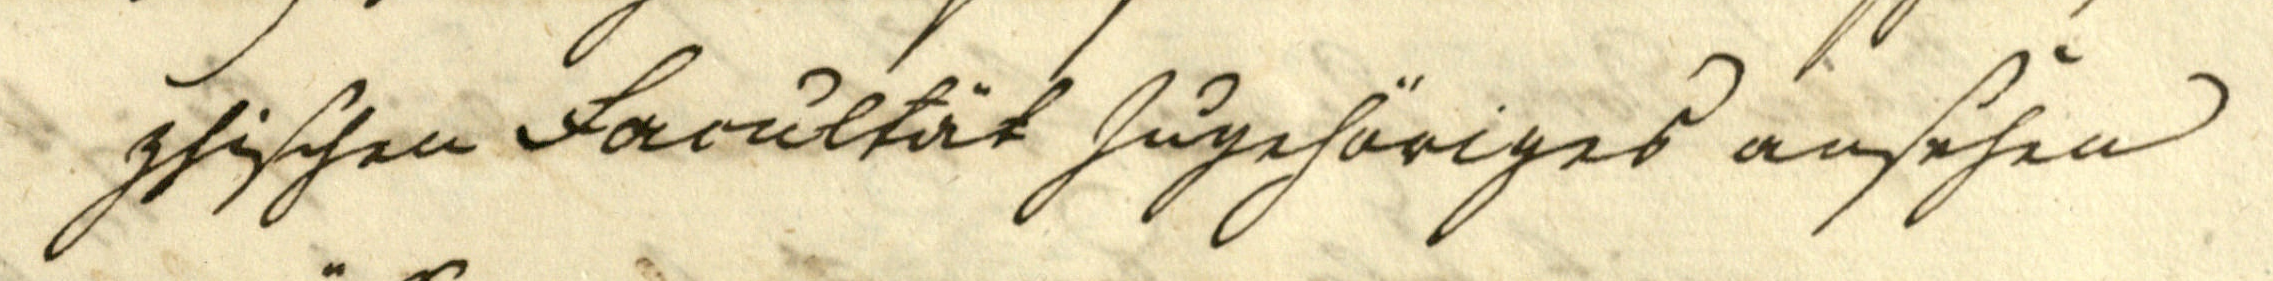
phischen Facultät zugehöriges ansehen
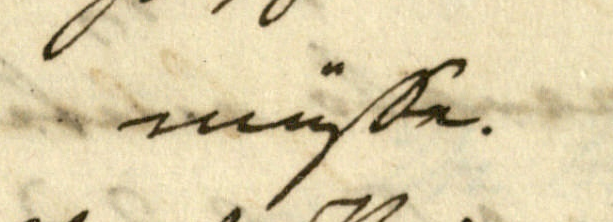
müsse.
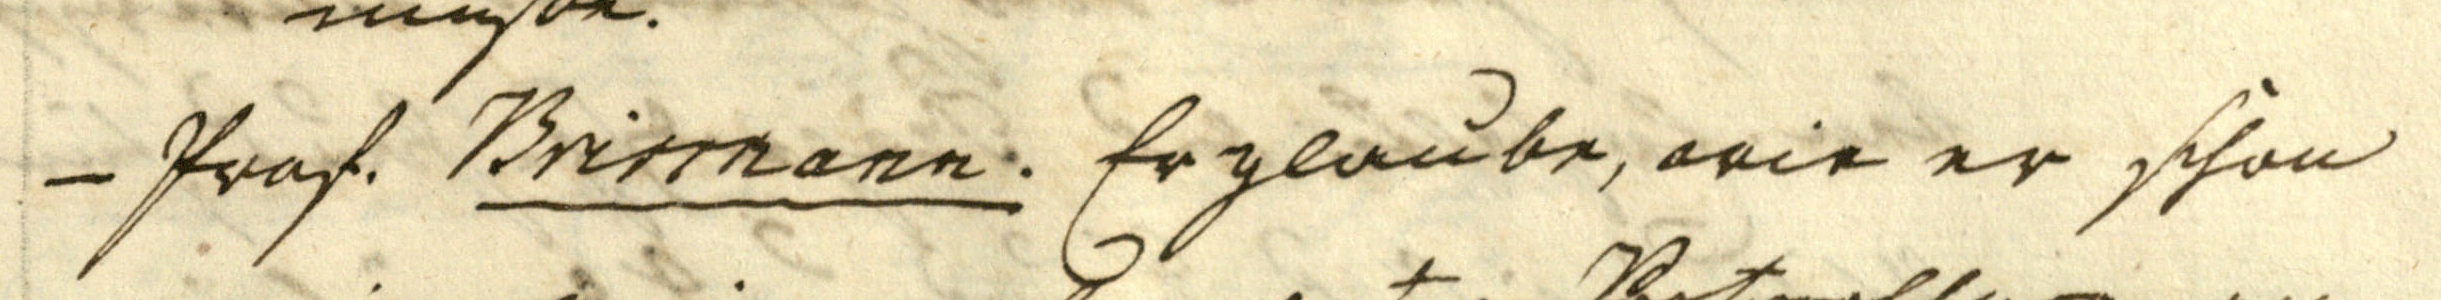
Prof. Brismann. Er glaube, wie er schon
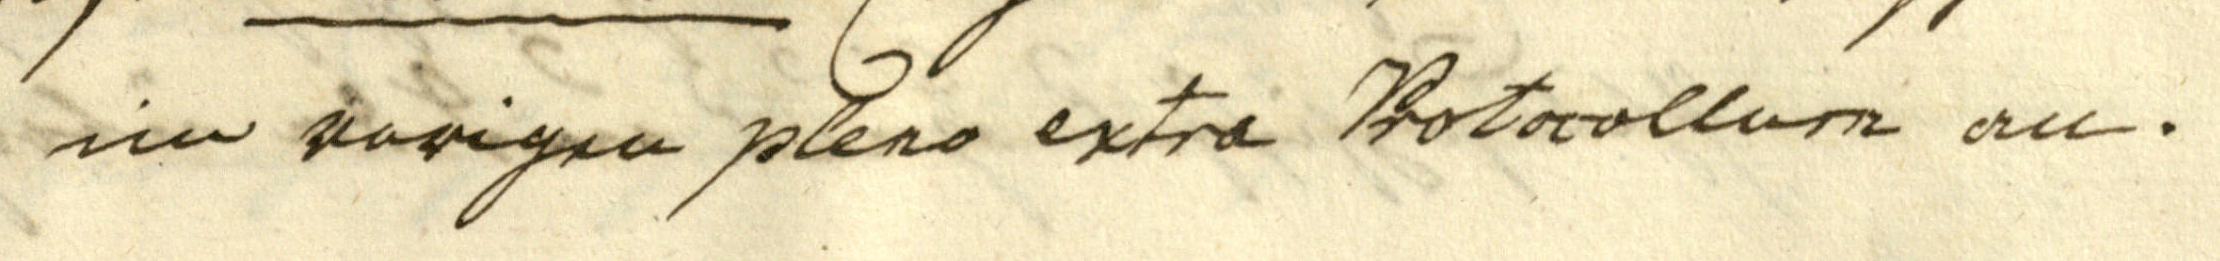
im vorigen pleno extra Protocollum an¬
